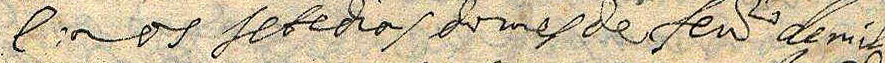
Em os sete dias do mes de feuro de mil
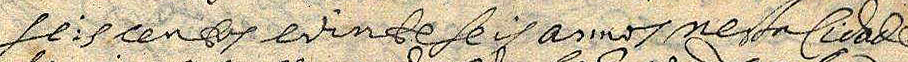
seiscentos e vinte seis annos nesta Cidade
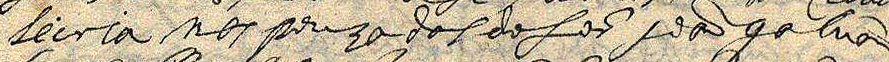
Leiria nas pouzadas do sor̄ joão galuão
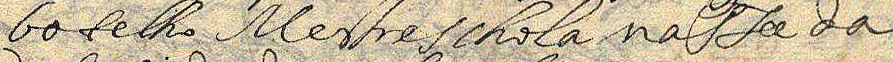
botelho Mestre schola na sta See da
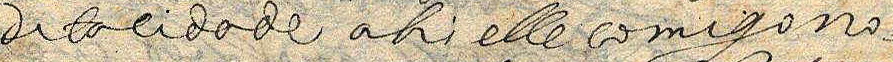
dita cidade ahi elle comigo no
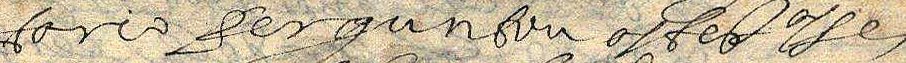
tario perguntou as testas se
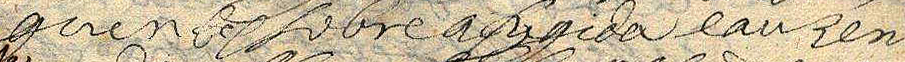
guintes sobre a fugida e auzen
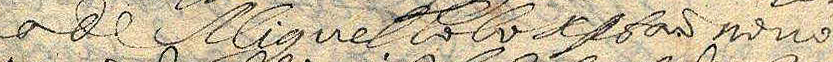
cia de Miguel lobo xptaõ nouo
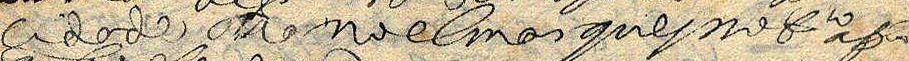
cidade Manoel marques notro apco
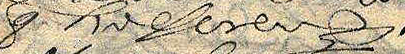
q̄ ho escreuy.
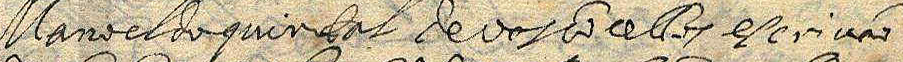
Manoel do quintal de vascōcellos escriuão
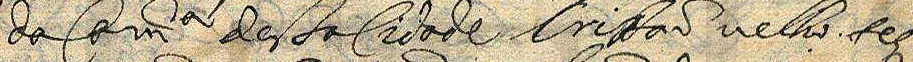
da Camra desta Cidade Cristaõ uelho tes
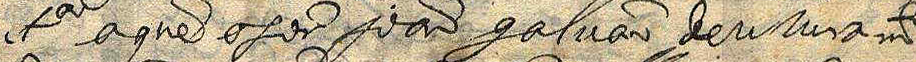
ta a quē o sor̄ joaõ galuão deu iuramto
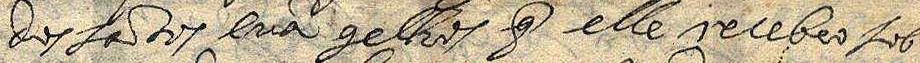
dos sātos euāgelhos q̄ elle recebeo sob
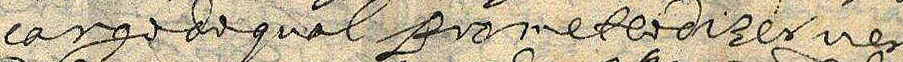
cargo do qual prometeo dizer uer
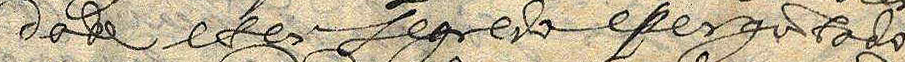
dade e ter segredo e pergūtado
